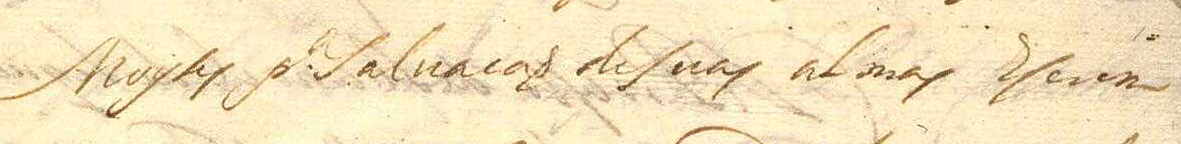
Moyses p.a saluacaõ de suas almas E serem
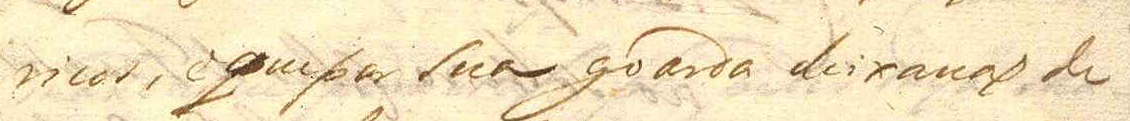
ricos, e que por sua goarda deixauaõ de
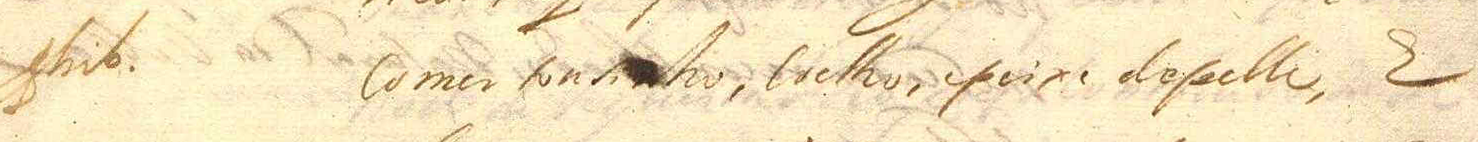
ꝓhib. comer tousinho, Coelho, e peixe de pelle, E
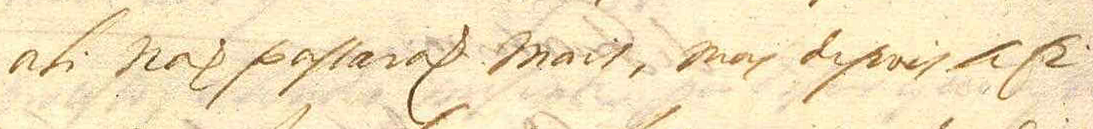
ali naõ passaraõ mais, mas depois se fi
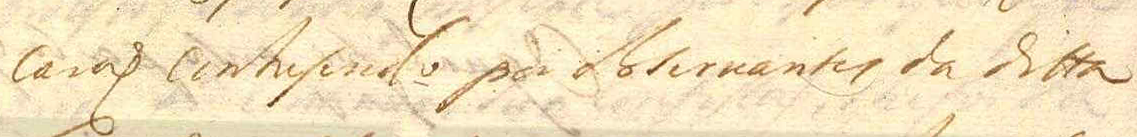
caraõ conhesendo por obseruantes da ditta
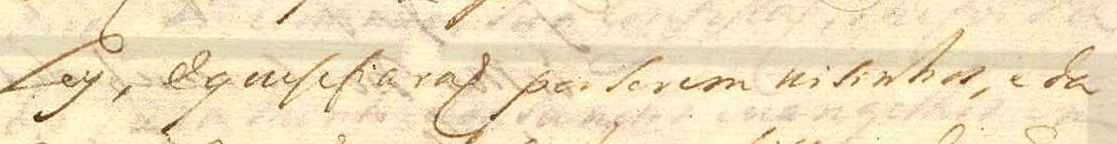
Ley, ē que se fiaraõ por serem uisinhos, e da
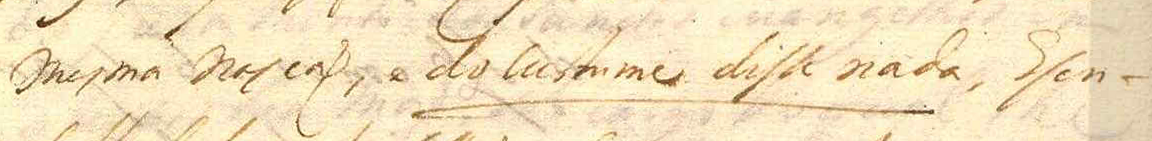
mesma nasçaõ, e do custume disse nada, E sen
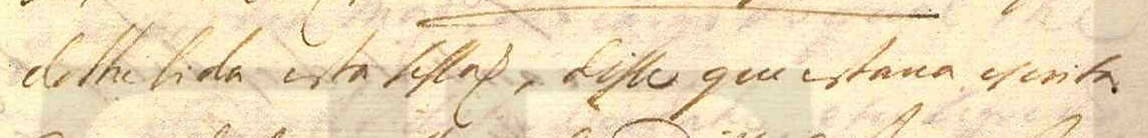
dolhe lida esta sessaõ, disse que estaua escrita
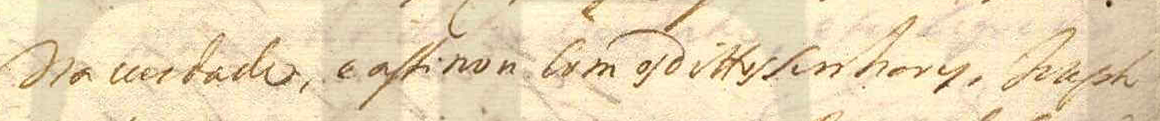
na uerdade, e assinou com os dittos senhores, Jozeph
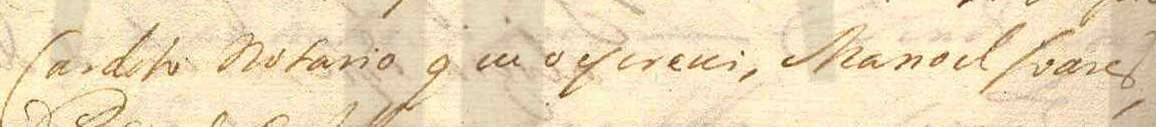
Cardoso notario que o escreui, Manoel Soares
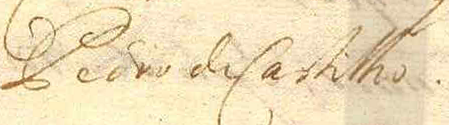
Pedro de Castilho.
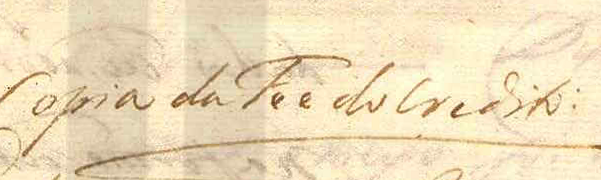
Copia da Fee do credito.
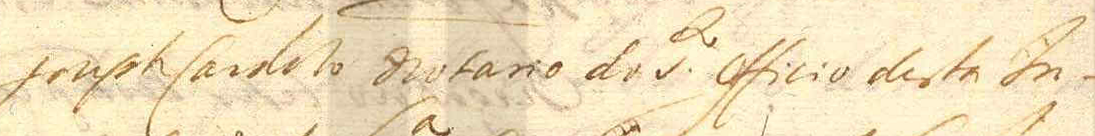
Jozeph Cardoso notario do s.to officio desta In
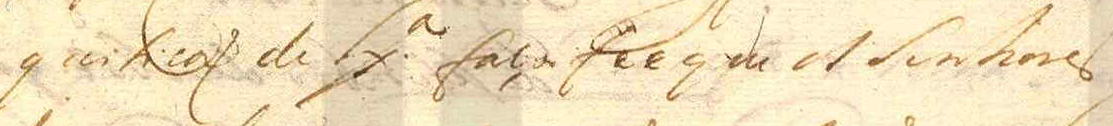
quisiçaõ de Lx.a faça fee que os Senhores
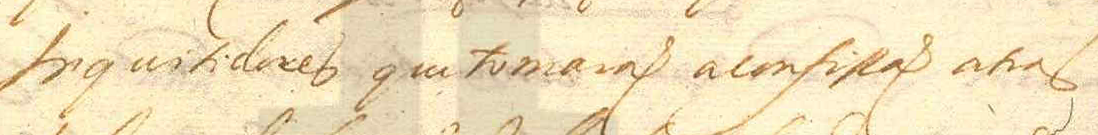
Jnquisidores que tomaraõ a confissaõ atras
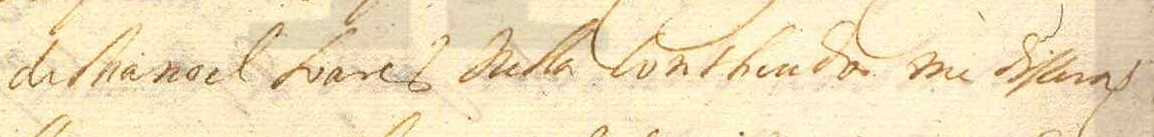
de Manoel Soares nella contheudo me disseraõ
